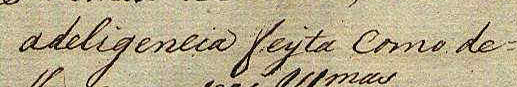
a deligencia feyta como de
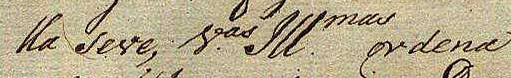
lla se ve, V.as Ill.mas ordena
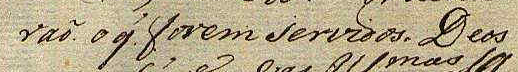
raõ o q̄ forem servidos. Deos
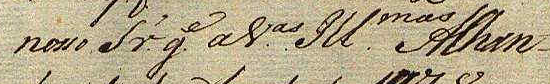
nosso Sr̄ g.e a V.a Ill.mas Alhan
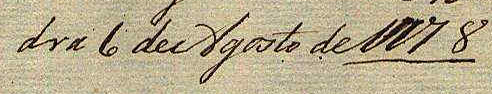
dra 6 de Agosto de 1778
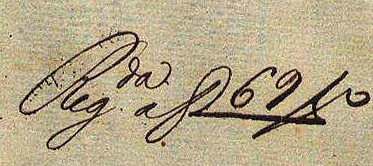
Reg.da a fl69 vo
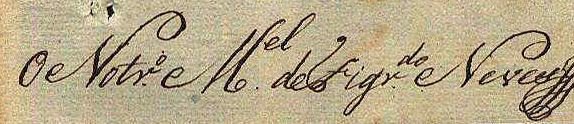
O Notr.o M.el de Figr.do Neves
